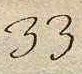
33
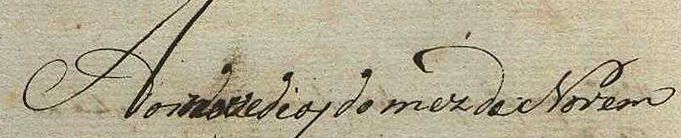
Aos doze dias do mez de Novem
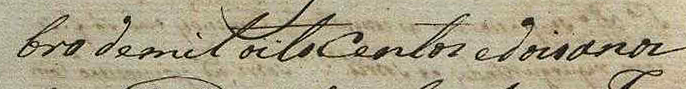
bro de mil oitocentos e dois anoz
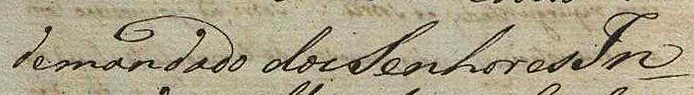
de mandado dos Senhores In
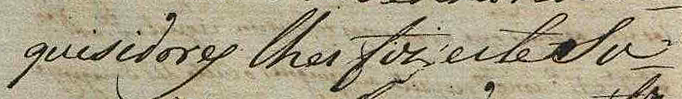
quisidores lhes fiz este Su
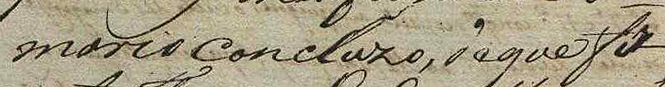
mario concluzo, de que fiz
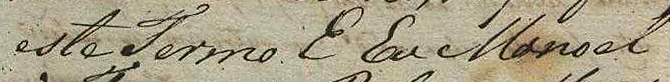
este Termo E Eu Manoel
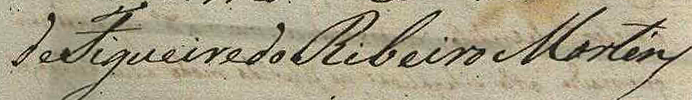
de Figueiredo Ribeiro Martins
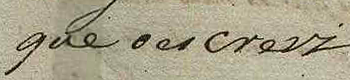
que o escrevj
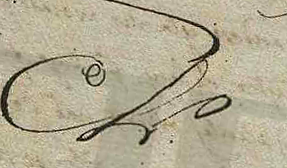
CL.o
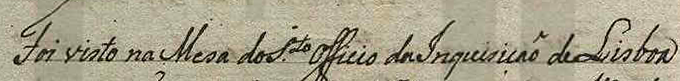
Foi visto na Mesa do S.to Officio da Inquisiçaõ de Lisboa
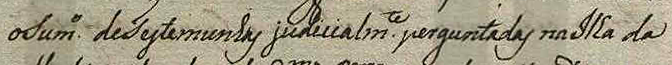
o Sum.o de Testemunhas judicialm.te perguntadas na Ilha da
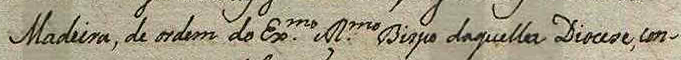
Madeira, de ordem do Ex.mo e R.mo Bispo daquella Diocese, con
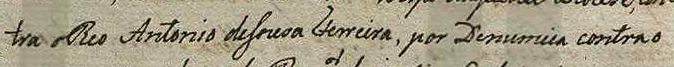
tra o Reo Antonio de sousa Ferreira, por Denumcia contra o
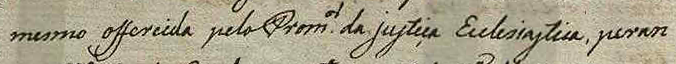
mesmo offercida pelo Prom.or da justiça Ecclesiastica, peran
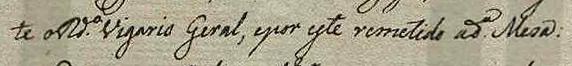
te o Rd.o Vigario Geral, e por este remetido a d.a Mesa:
